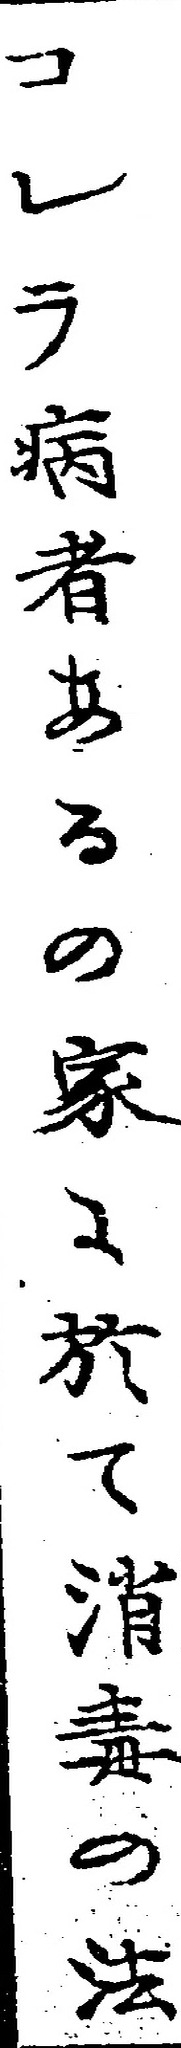コレラ病者あるの家に於て消毒の法
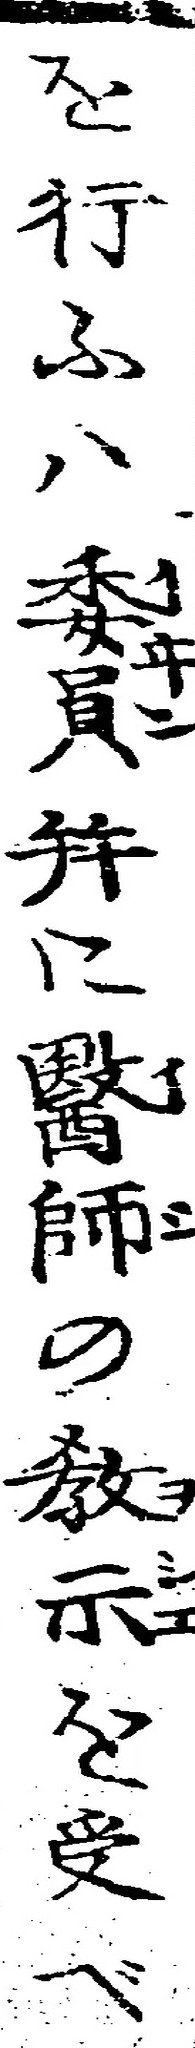を行ふは委員幷に醫師の教示を受べ
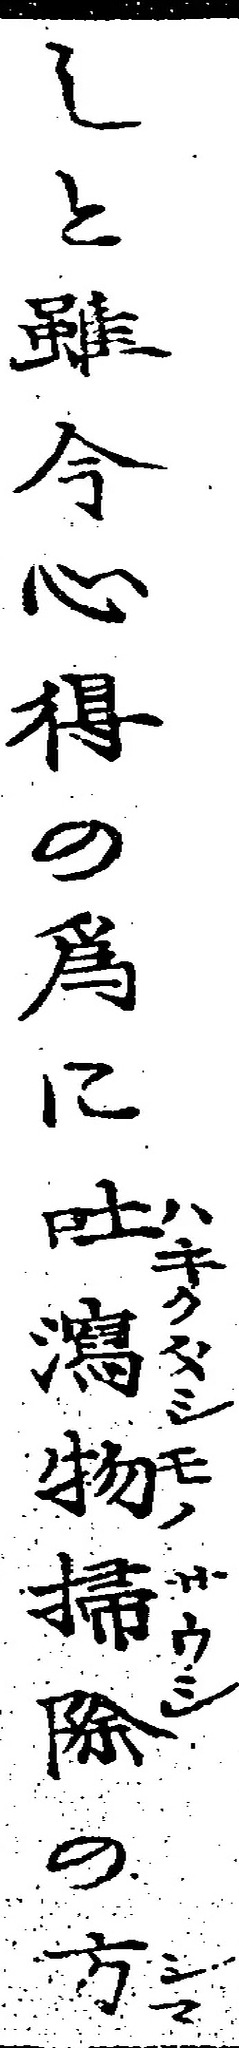しと雖今心得の為に吐瀉物掃除の方
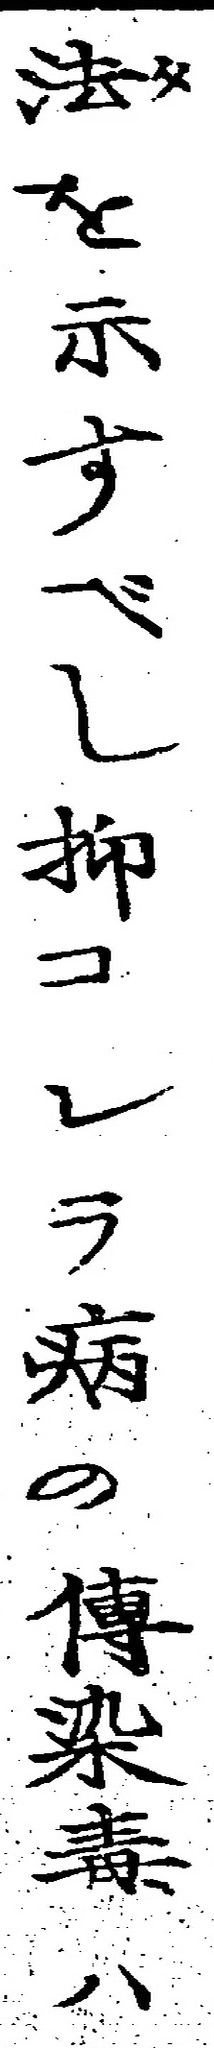法を示すべし抑コレラ病の傅染毒は
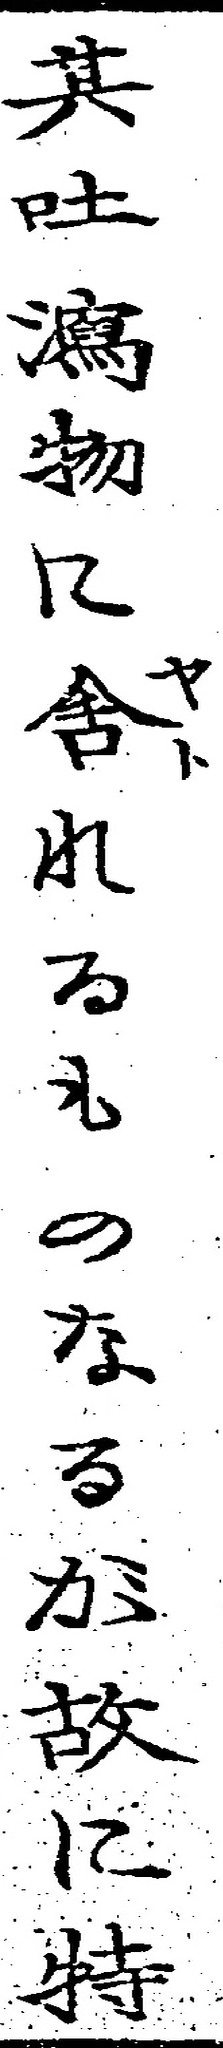其吐瀉物に舎れるものなるが故に特
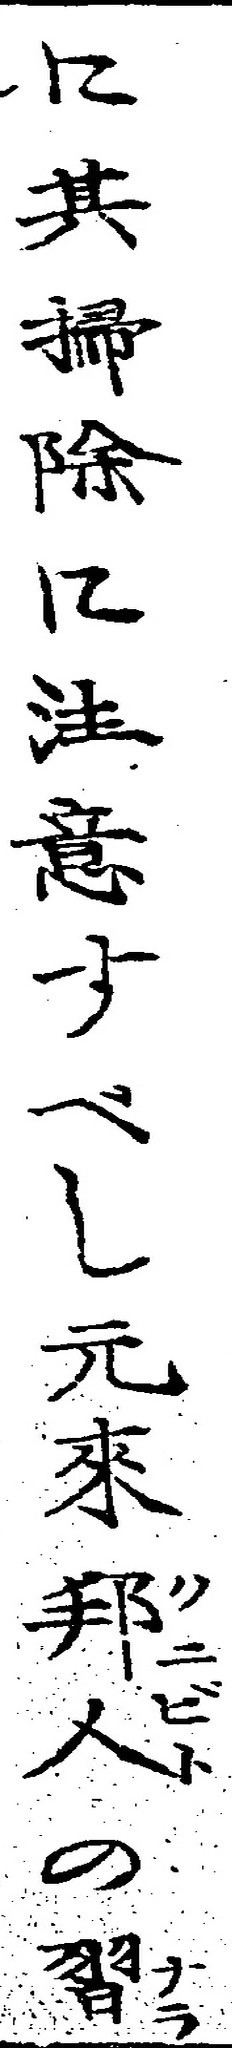に其掃除に注意すべし元來邦人の習
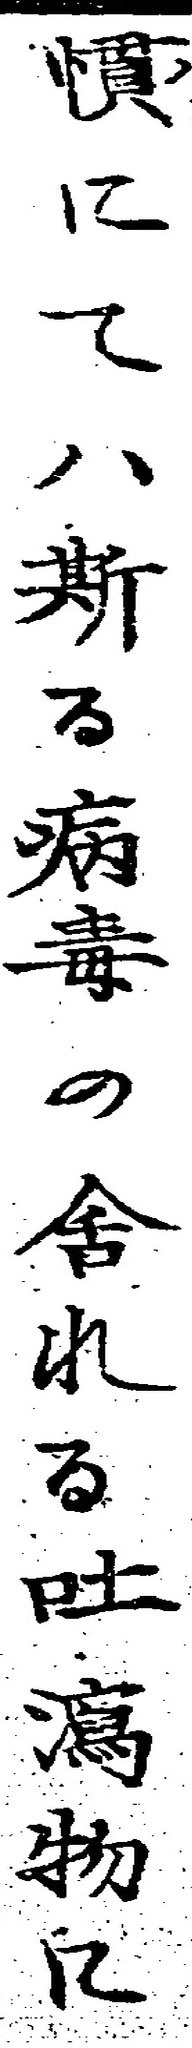慣にては斯る病毒の舎れる吐瀉物に
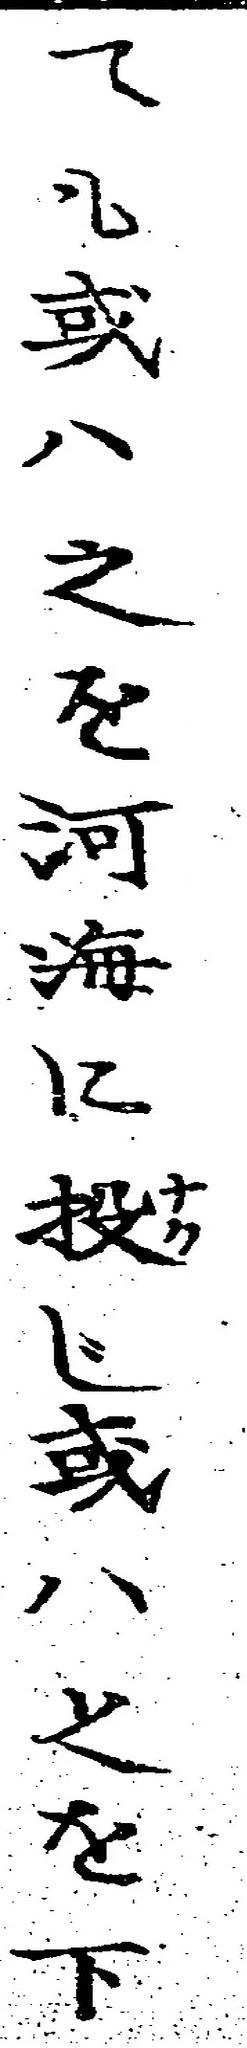ても或は之を河海に投じ或は之を下
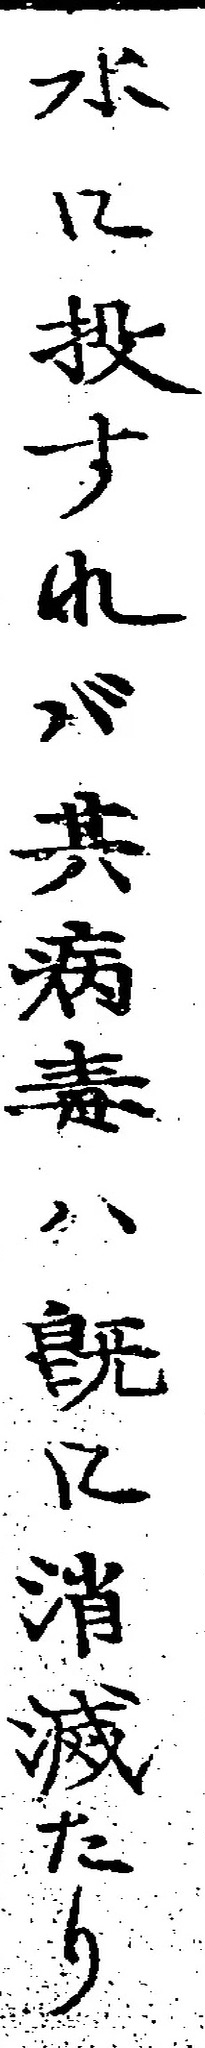水に投すれば其病毒は既に消滅たり

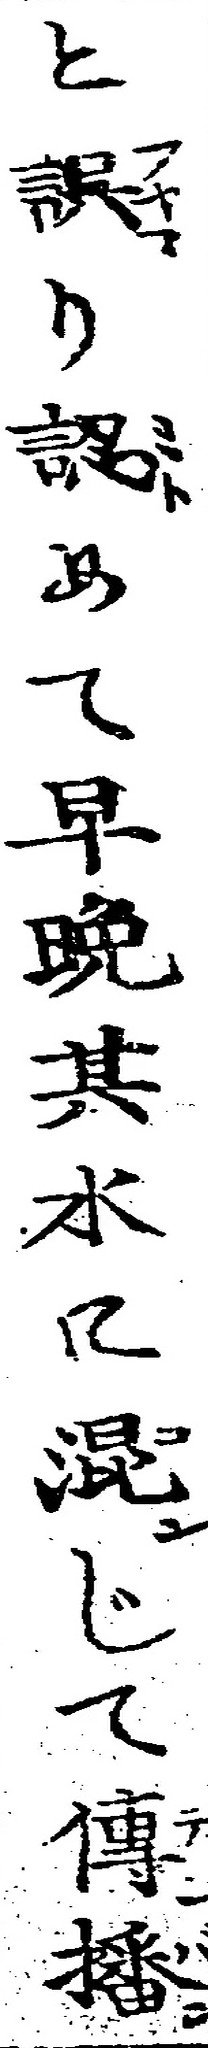と誤り認めて早晩其水に混じて傅播
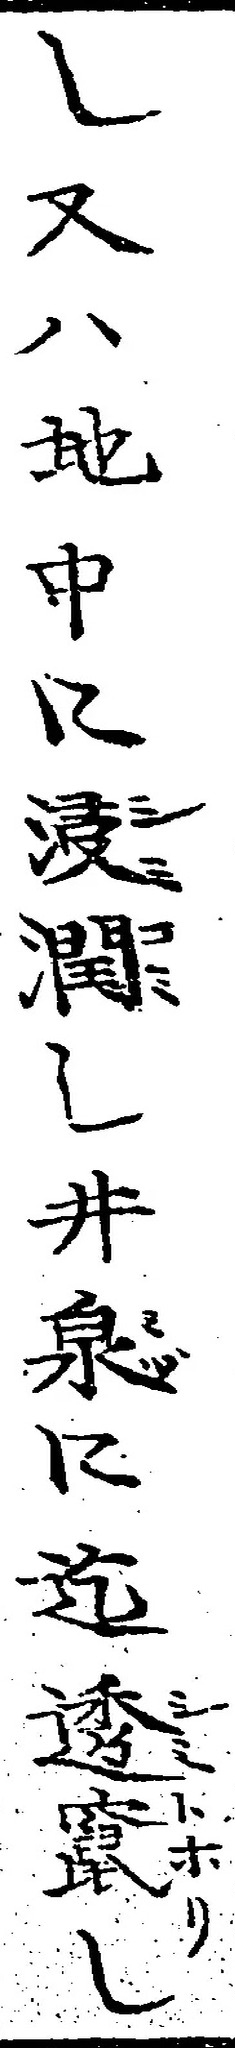し又は地中に浸潤し井泉に迄透竄し
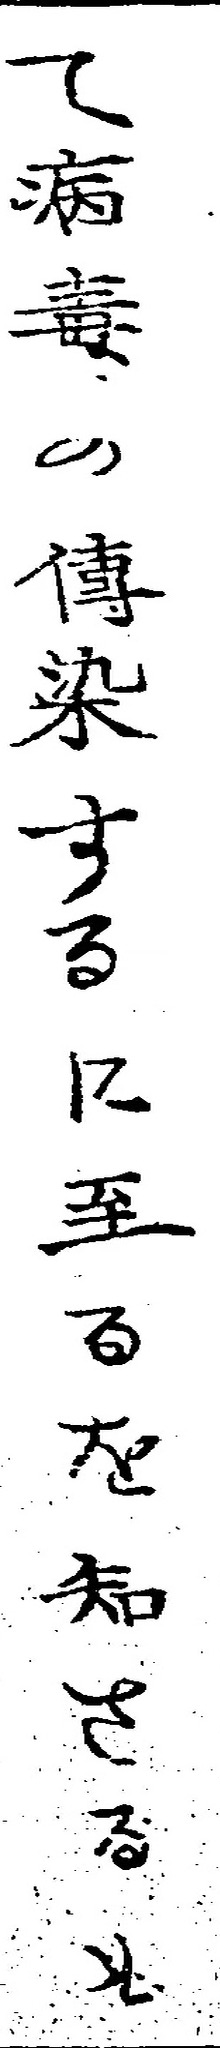て病毒の傅染するに至るを知らさるも
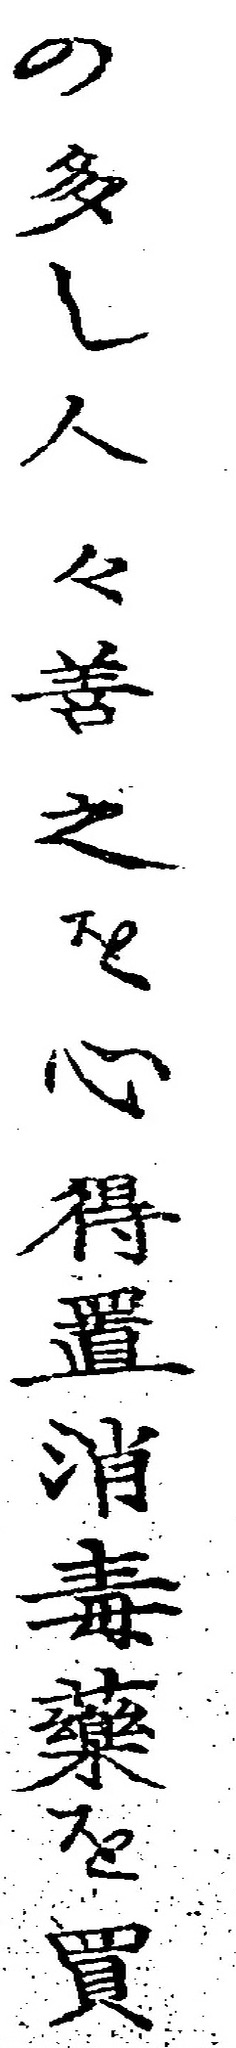の多し人々善之を心得置消毒藥を買
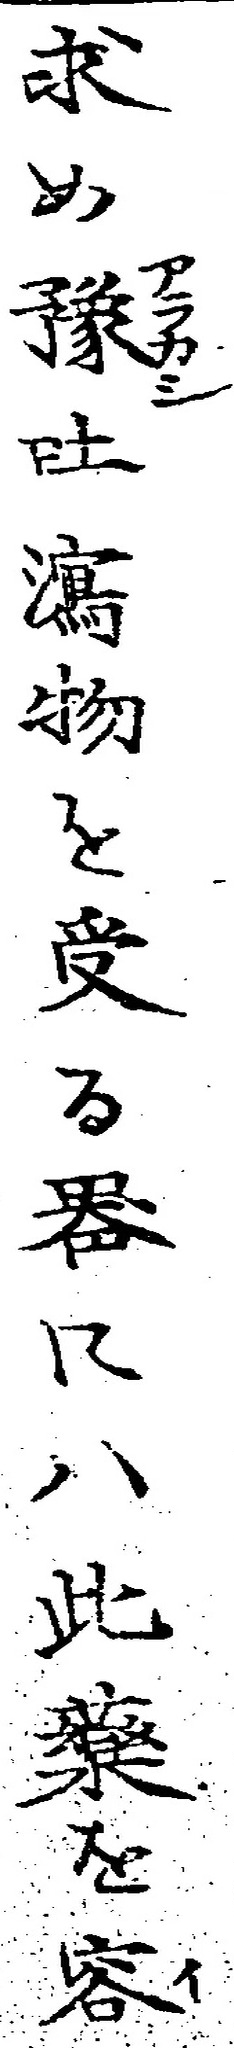求め豫吐瀉物を受る器には此藥を容
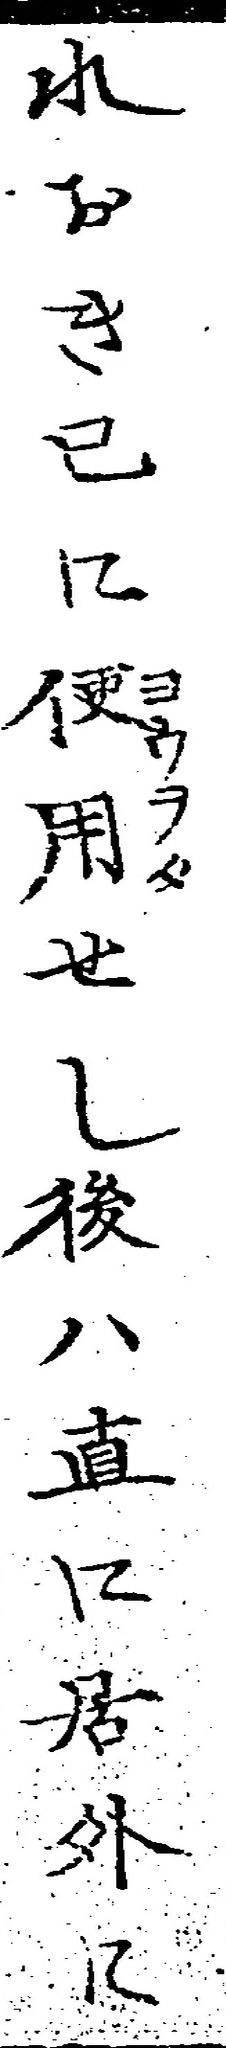れおき己に便用せし後は直に居外に
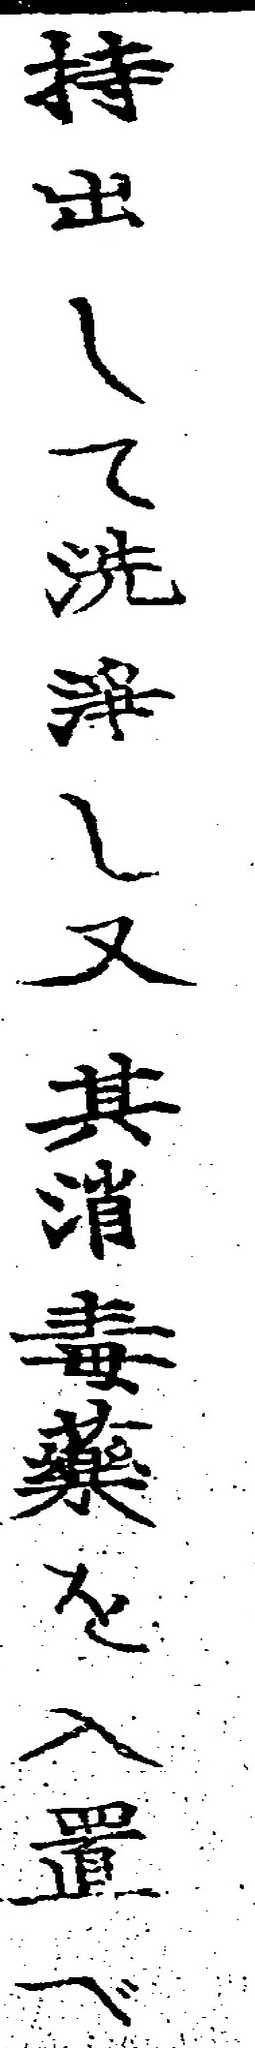持出して洗浄し又其消毒藥を入置べ
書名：虎列剌病予防用法
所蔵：国立国会図書館 National Diet Library, JAPAN
